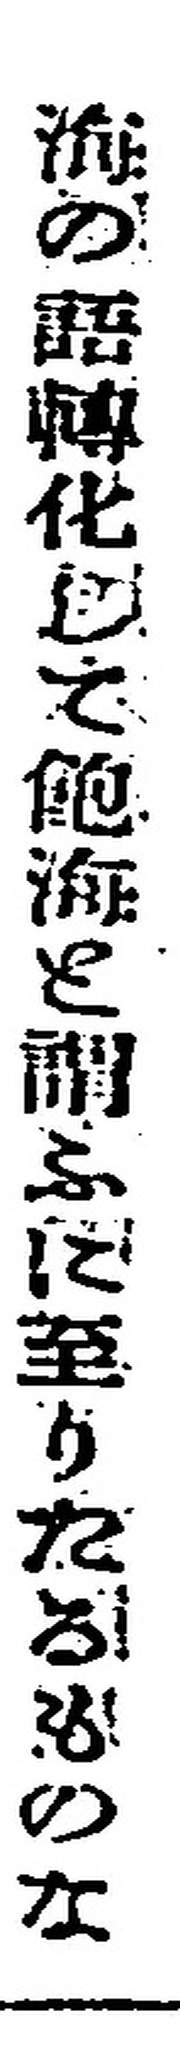海の語転化して飽海と謂ふに至りたるものな
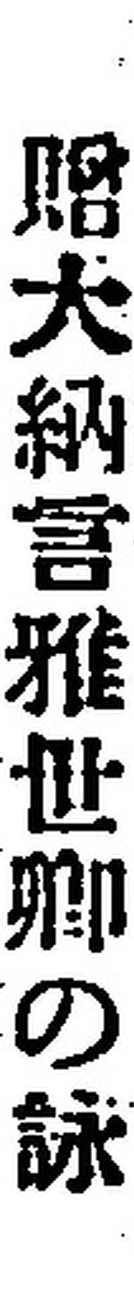贈大納言雅世卿の詠
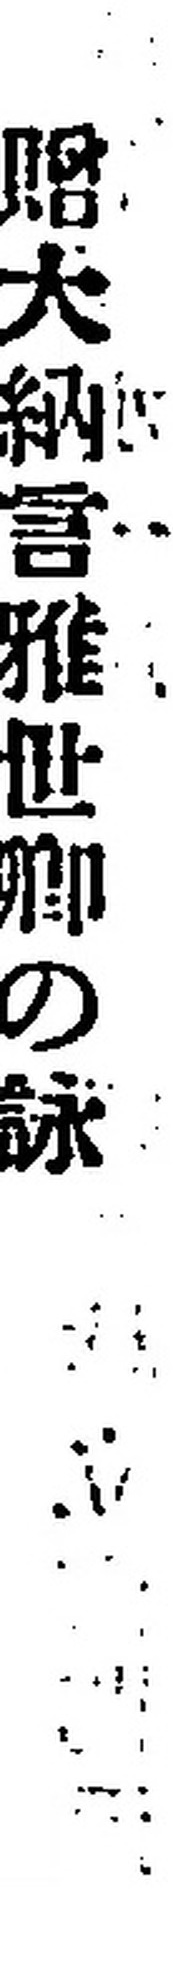贈大納言雅世卿の詠
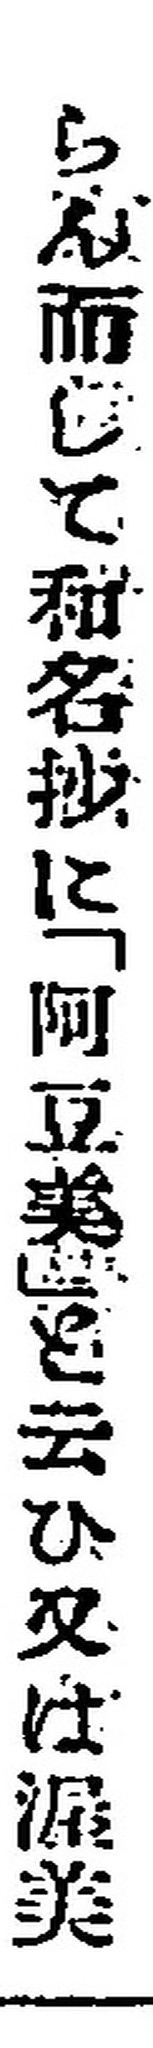らん而して和名抄に「阿豆美」と云ひ又は渥美
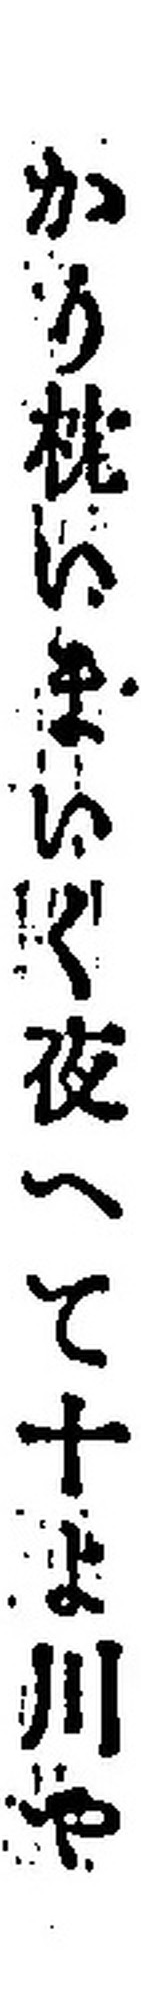かり枕いまいく夜へて十よ川や
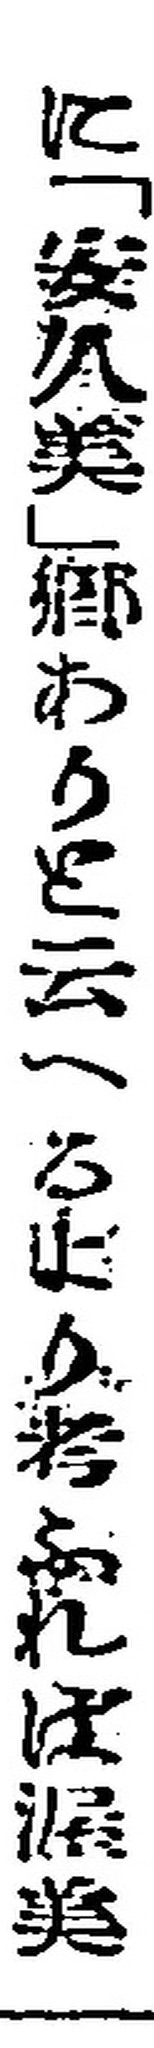に「安久美」郷ありと云へるより考ふれば渥美
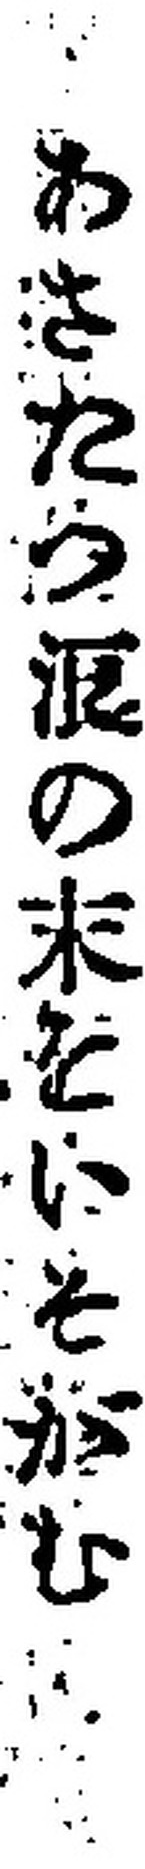あさたつ浪の末をいそがむ
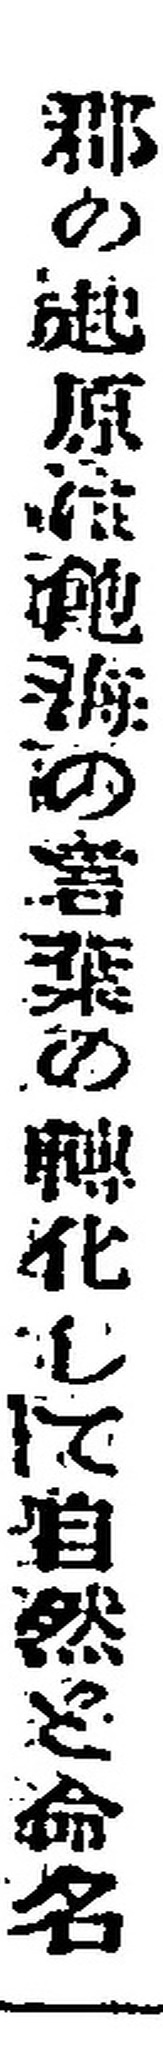郡の起原は飽海の言葉の転化して自然と命名
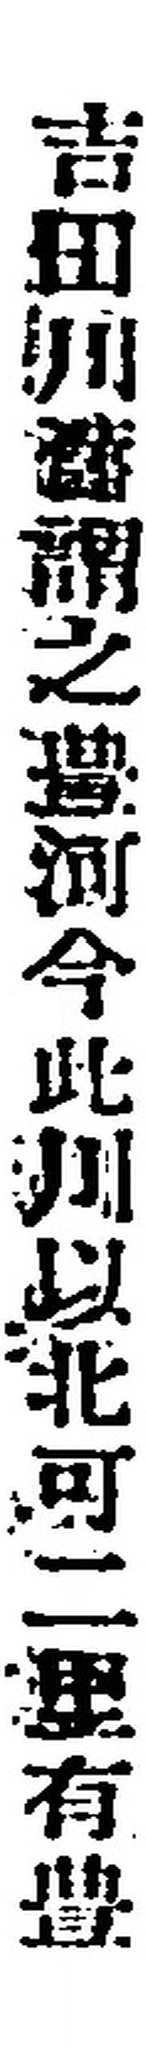吉田川旧謂之豊河今此川以北可二里有豊

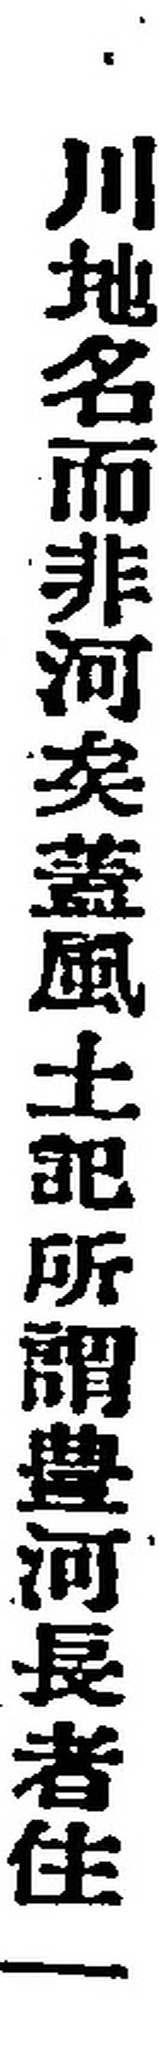川地名而非河矣蓋風土記所謂豊河長者住
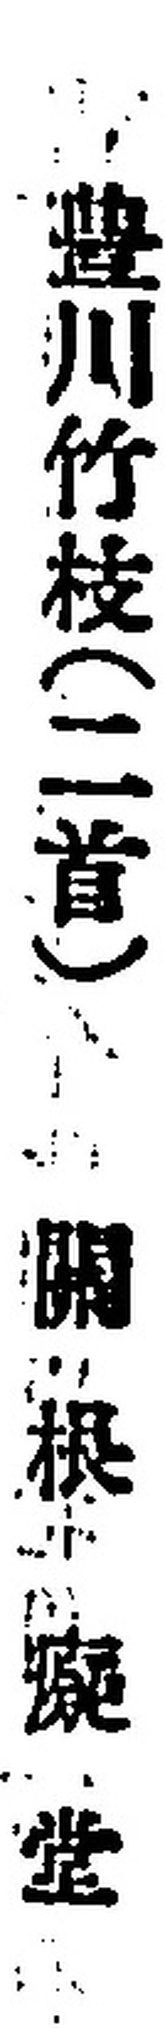豊川竹枝(二首)関根痴堂
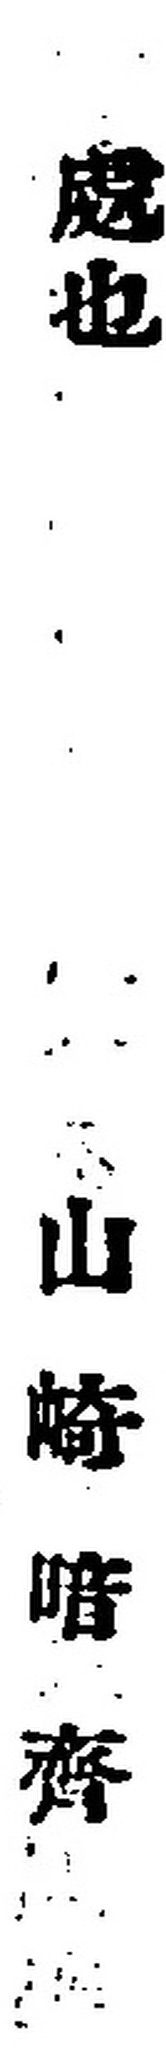処也山崎暗齋
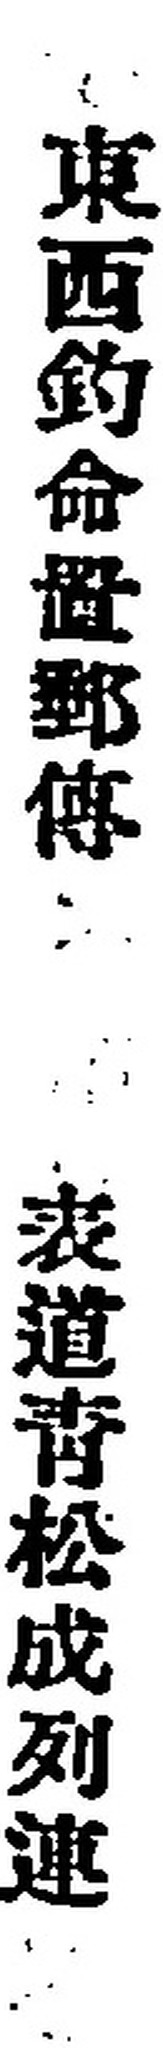東西釣命置郵伝表道青松成列連
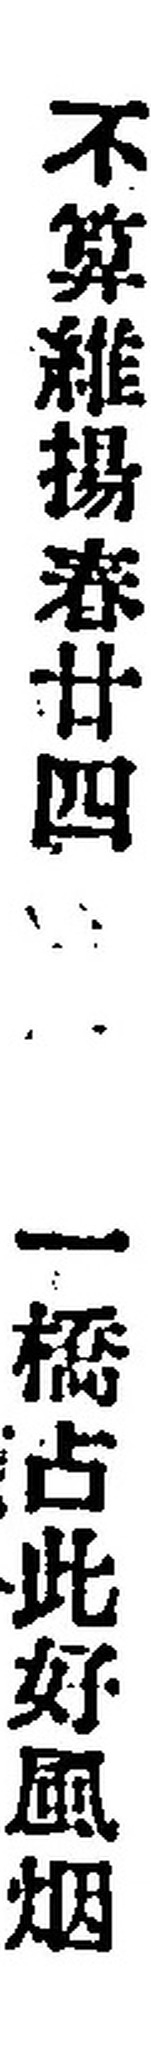不算維揚春廿四一橋占此好風烟
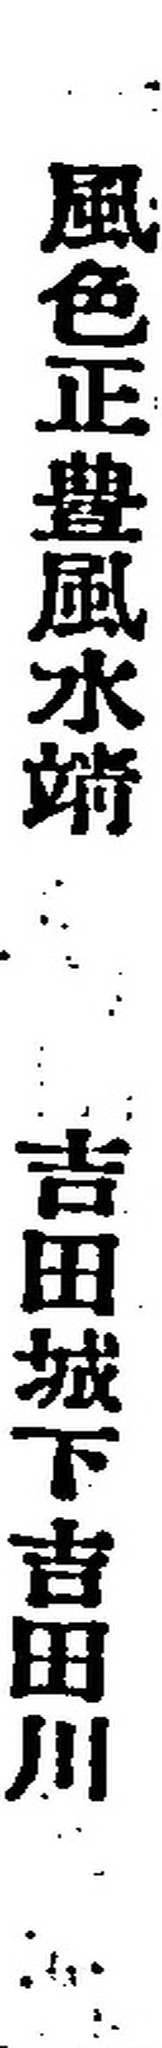風色正豊風水靖吉田城下吉田川
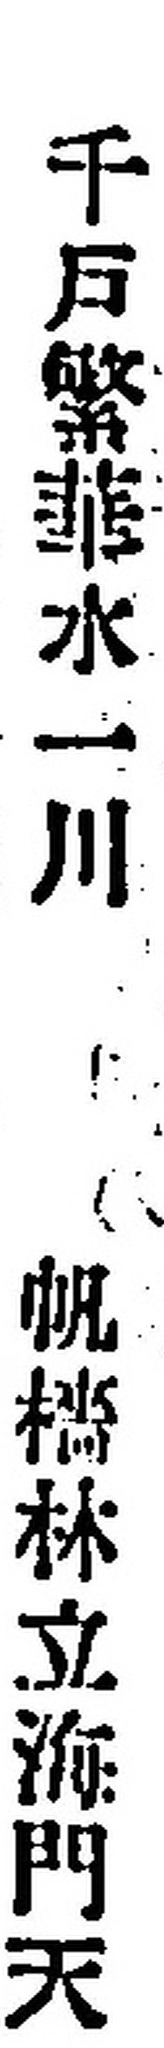千戸繁華水一川帆檣林立海門天
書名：東参名勝案内
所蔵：国立国会図書館 National Diet Library, JAPAN
